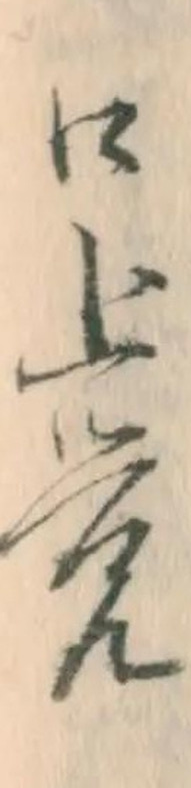口上覚
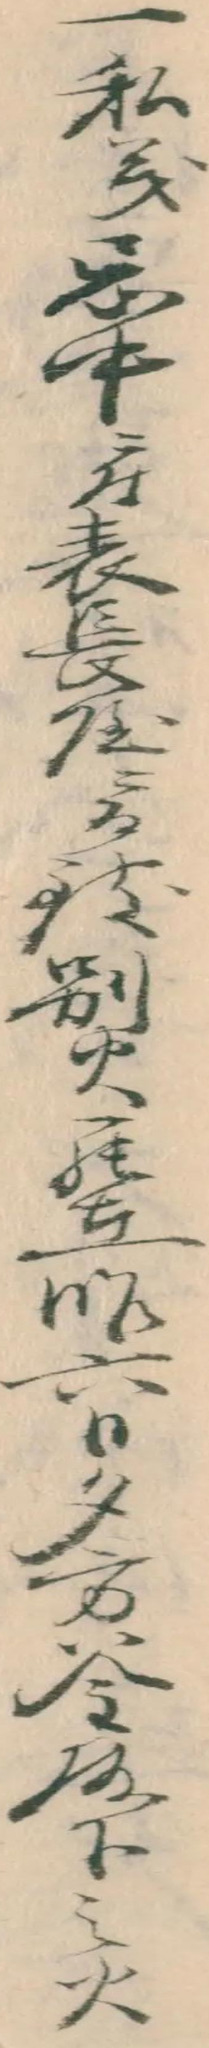一私義忌中ニ付表長屋ニ而致別火罷在昨六日夕方釜殿下之火
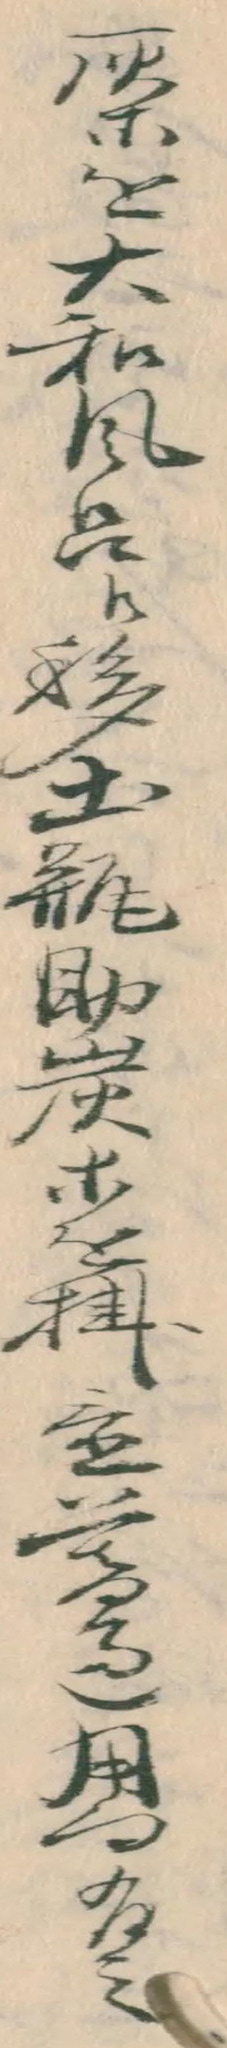灰等を大和風呂え移入土瓶助炭等を掛置暮過用向有之
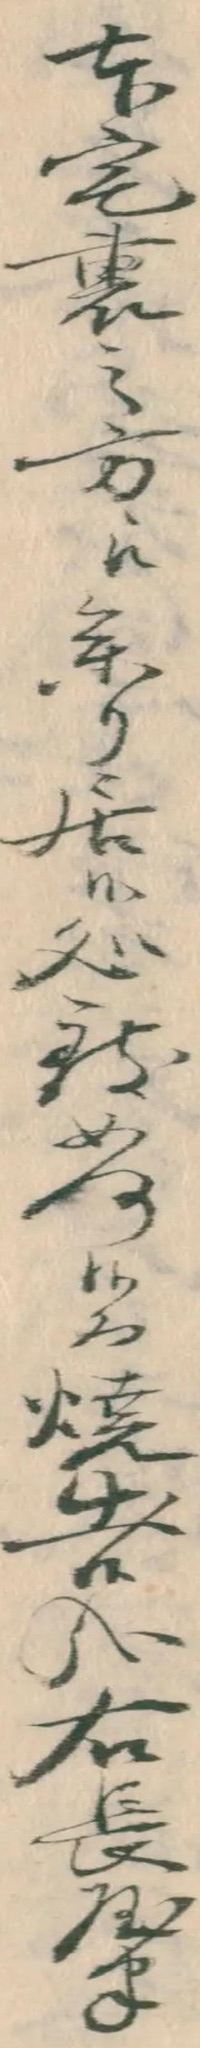本宅裏之方え参り居候処致如何候而焼出候哉右長屋半
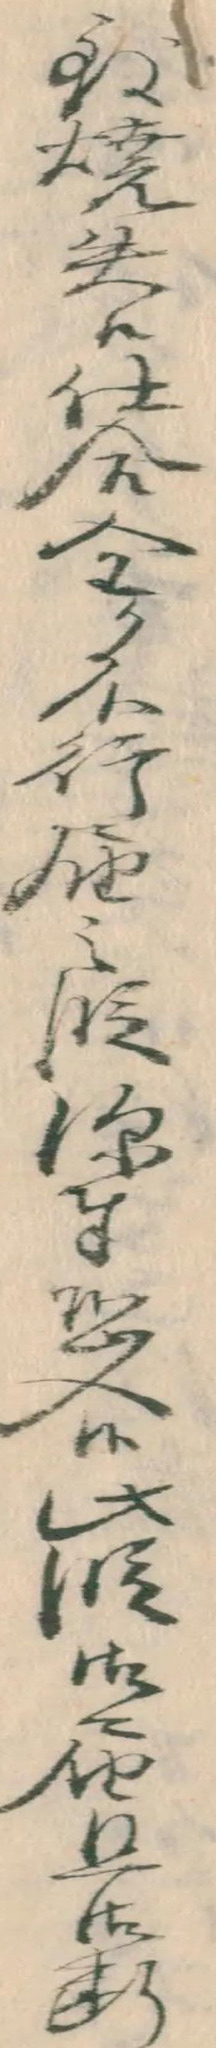致焼失候仕合全ク不行届之段深奉恐入候此段御届且御断
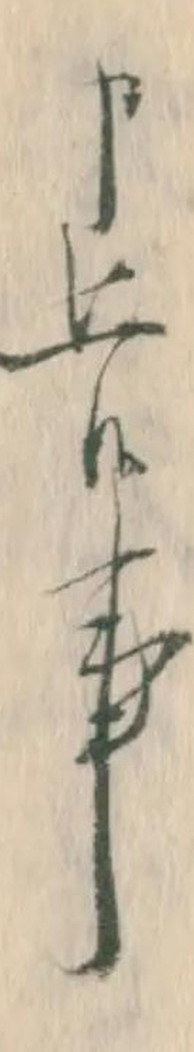申上候事
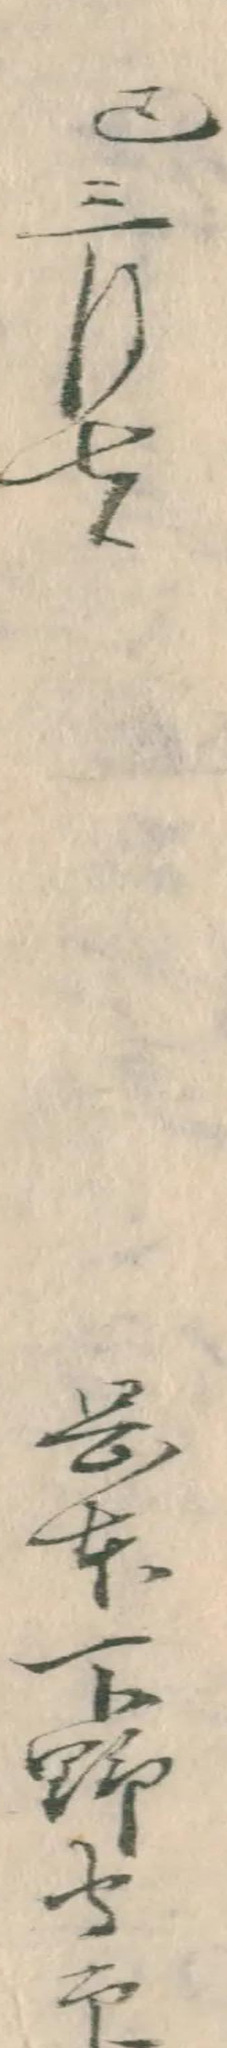巳三月七日岡本下野守印
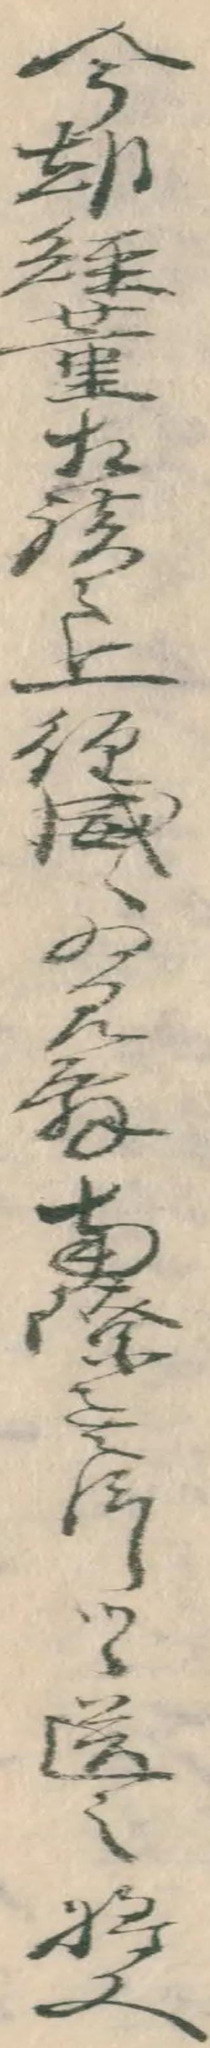今朝経董相談之上経威へ為見舞両際壱位ツヽ送之将又
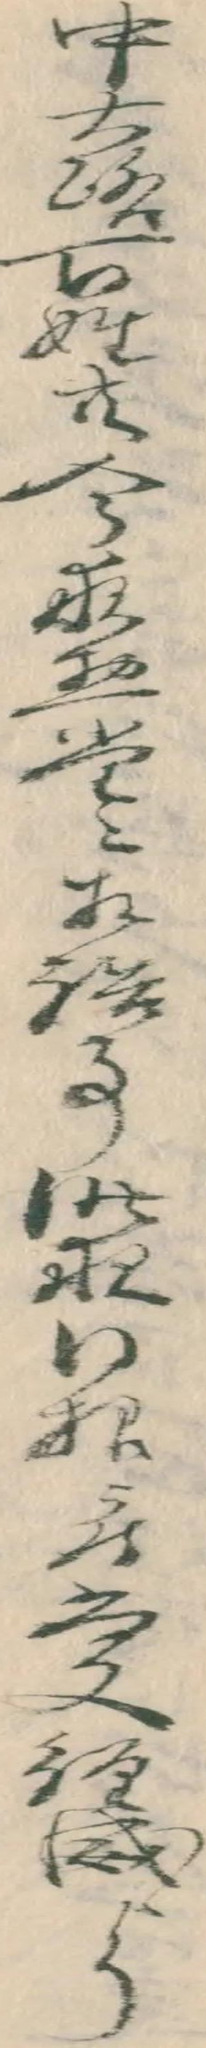中大路百姓共今夜惣堂に相詰事昨夜同様ニ付尚又経威より
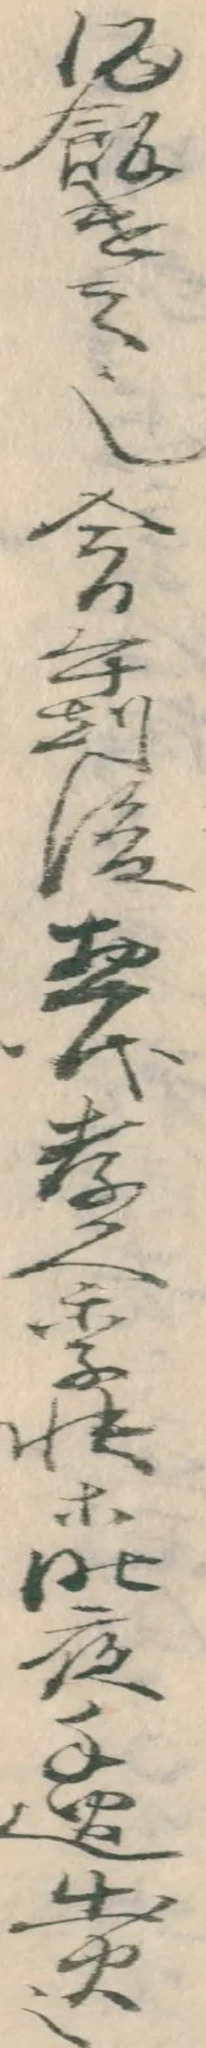酒飯遣之也今日午刻後惣代孝久季快等昨夜手過出火之
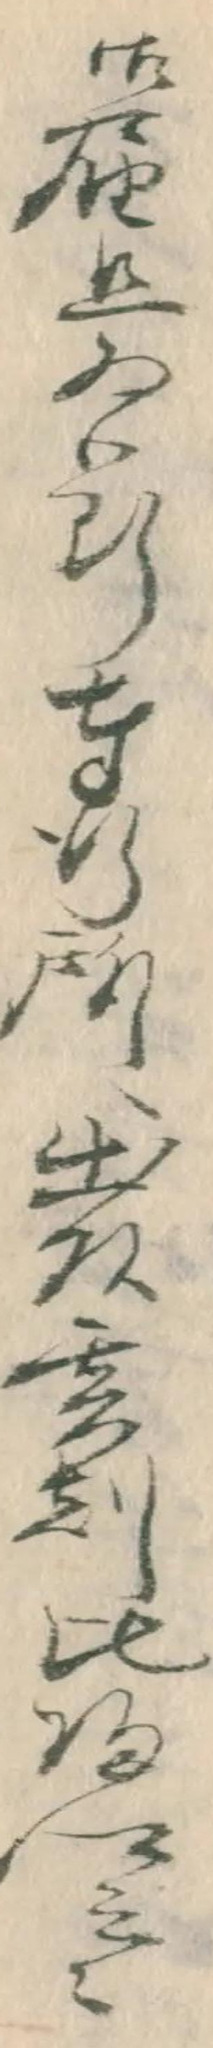御届且為御断奉行所へ出頭亥刻比帰郷云々
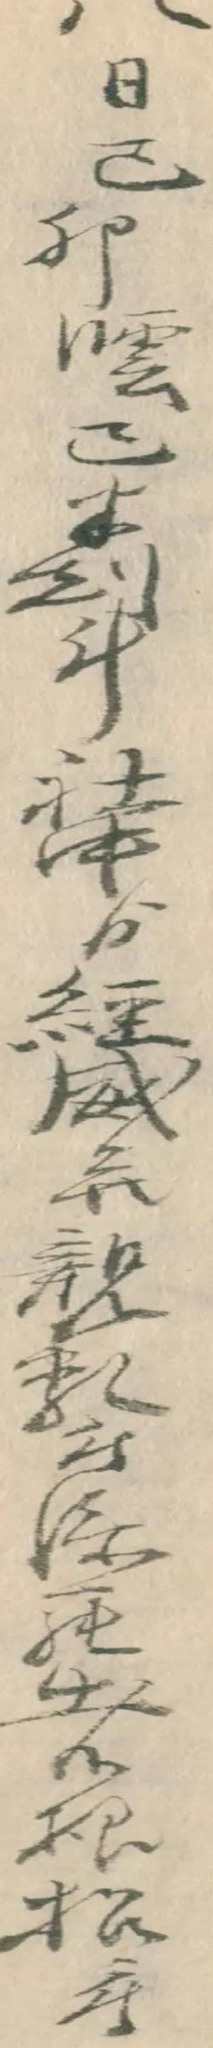八日己卯曇巳半刻斗社中ゟ経威并に親類方添罷出候様招付

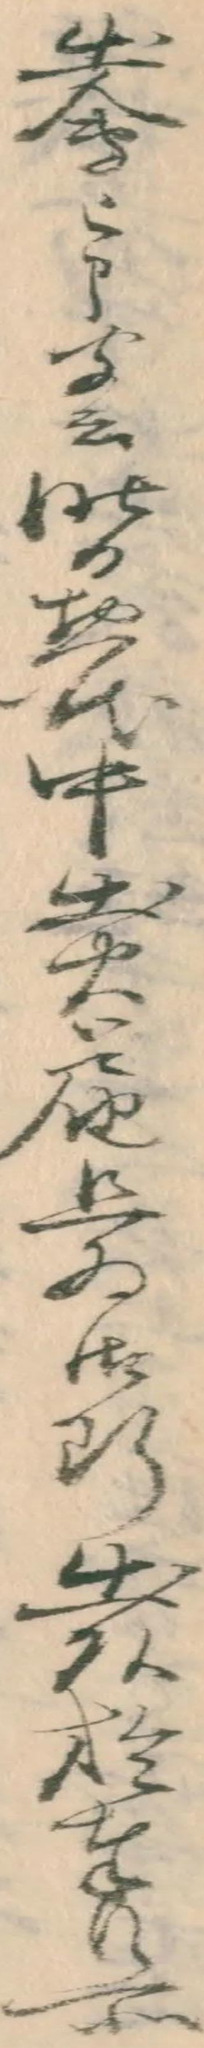出會被申聞云昨日惣代中出火御届且為御断出候於奉行所
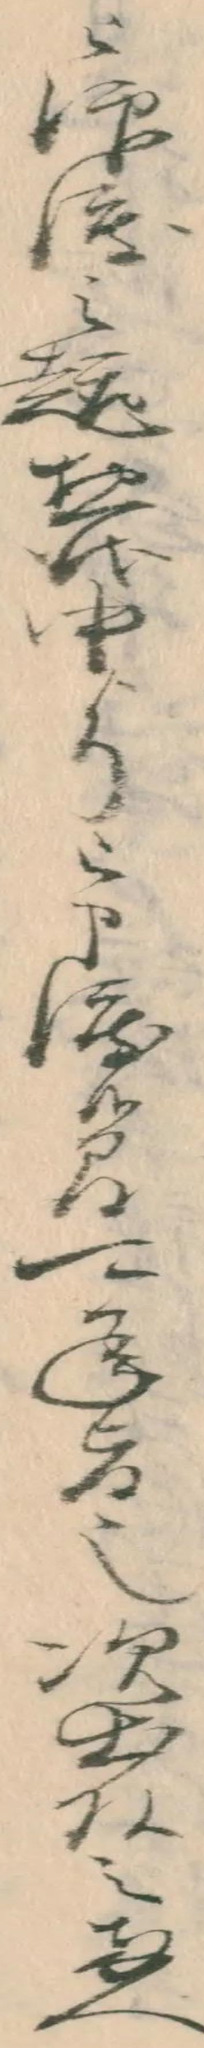被仰渡之趣惣代中より被申渡候間可承旨也次出頭之両人
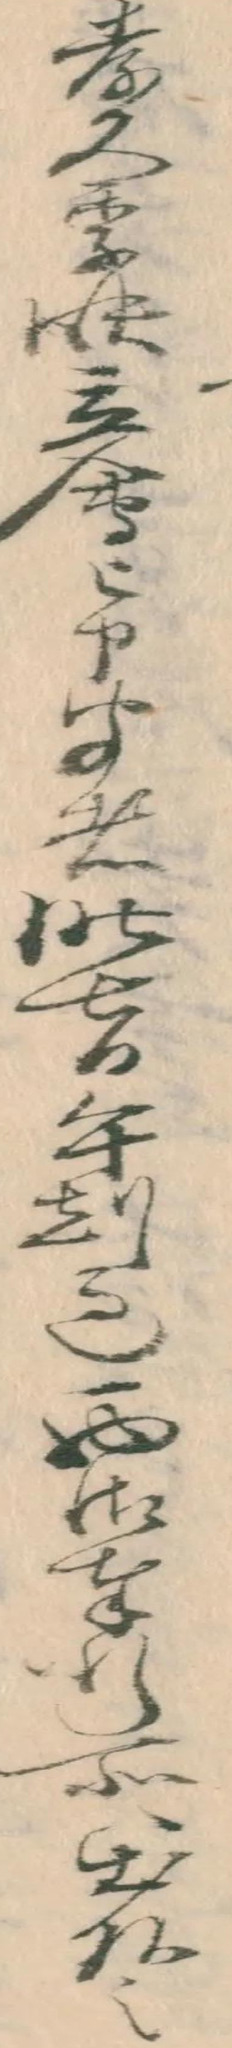孝久季快立會被申聞者昨七日午刻過西御奉行所へ出頭之
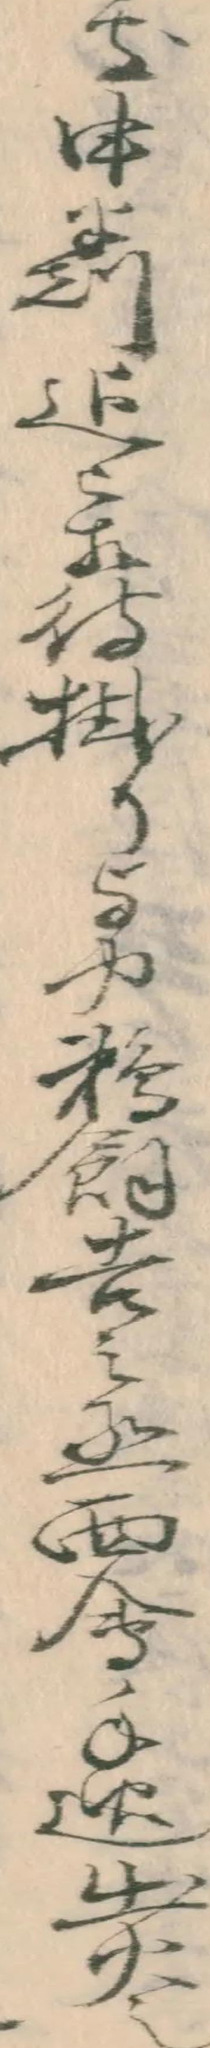處申半刻迄被相待掛り与力鵜飼吉之丞面會手迄出火之
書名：賀茂社記録. 第66冊
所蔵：国立国会図書館 National Diet Library, JAPAN
